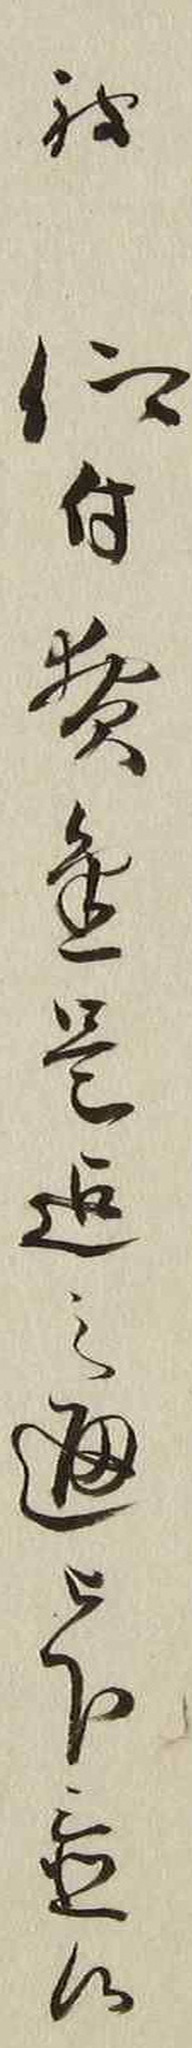被仰付費金是迄之通被下置候
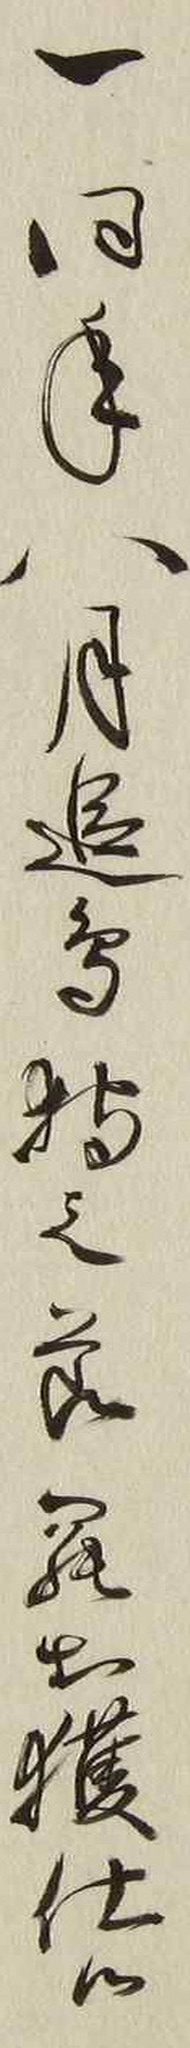一同年八月追鳥狩之節罷出獲仕候
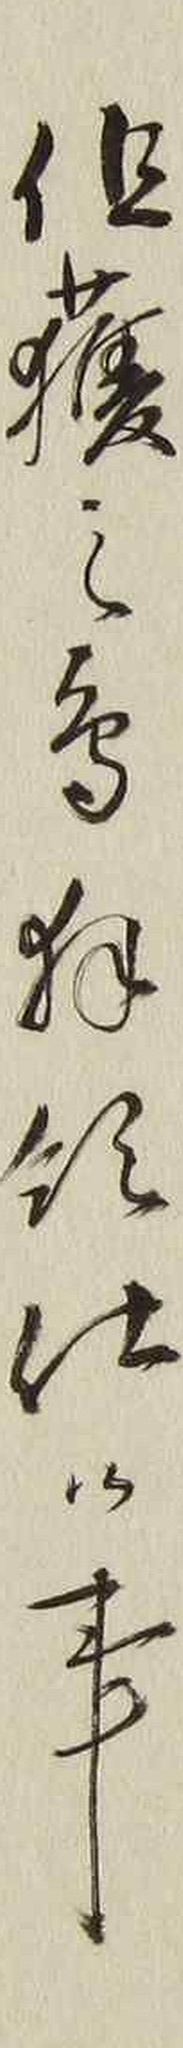但獲之鳥拝領仕候事
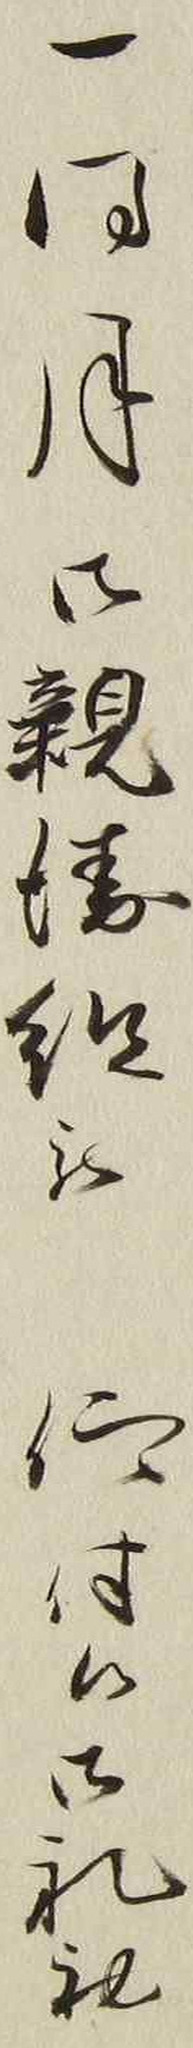一同月御親衛組被仰付候御礼初
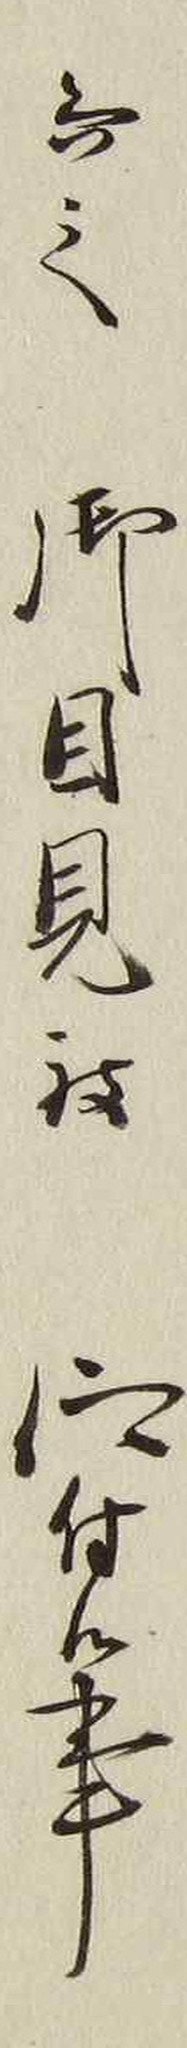而之御目見被仰付候事
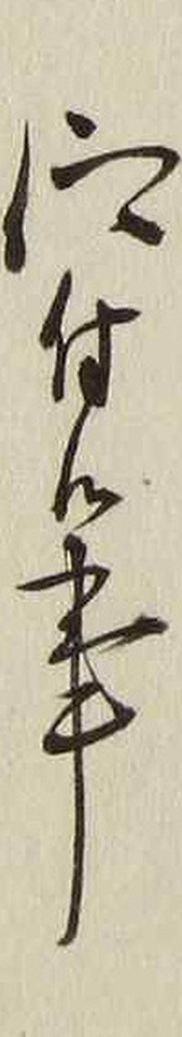仰付候事
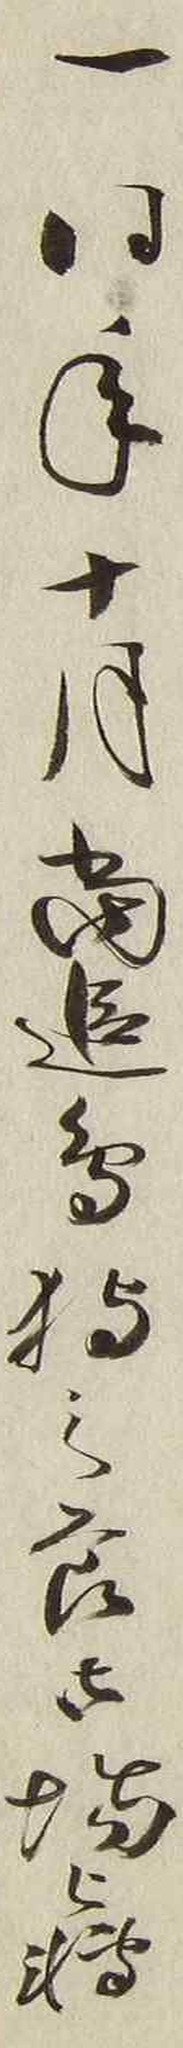一同年十月当追鳥狩之節御場被転
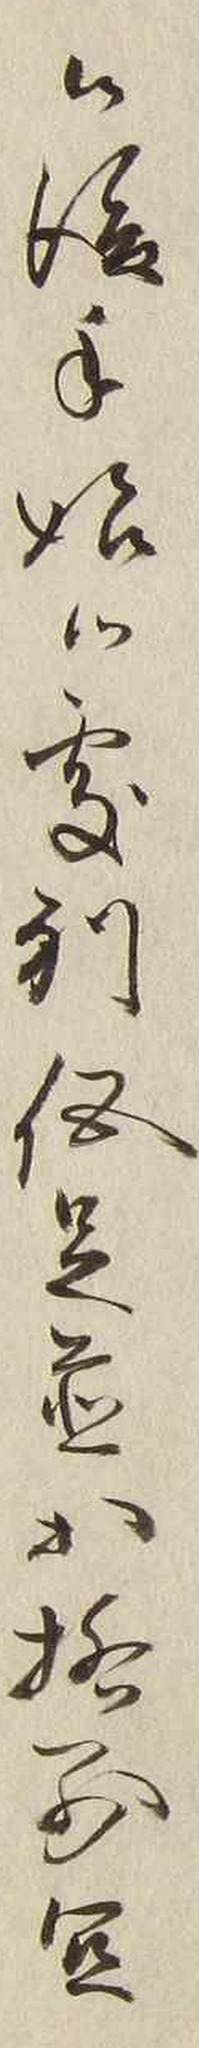候後手始候処列伍足並等格別宜

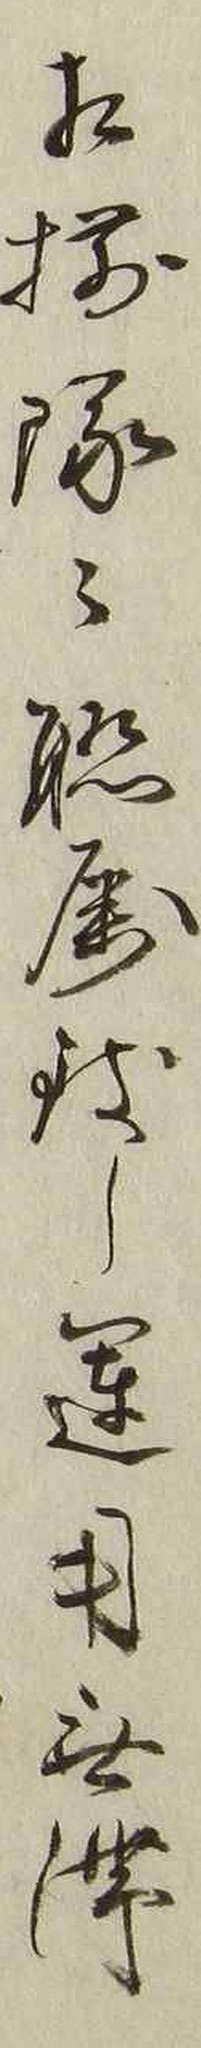相揃隊々連属致し運用無滞
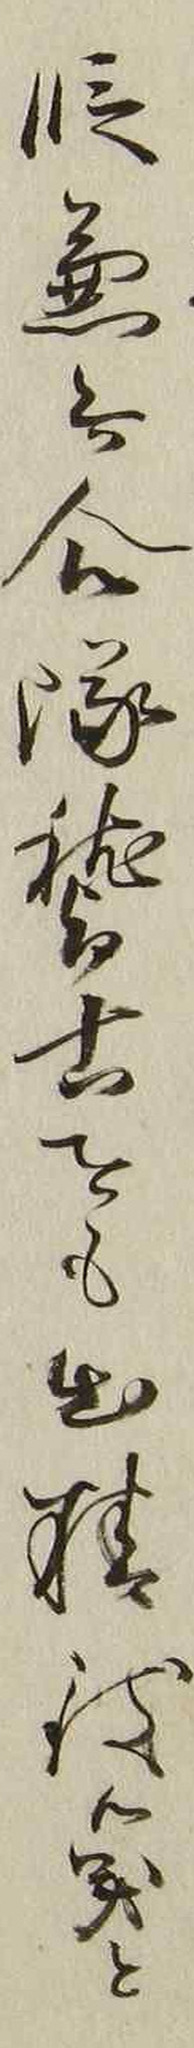段兼而合体稽古をも出精致候義と
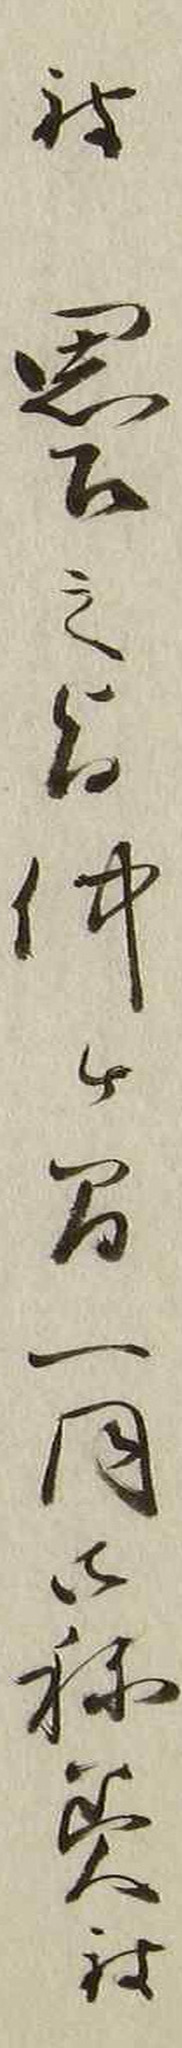被思召之旨仲ヶ間一同御称美被
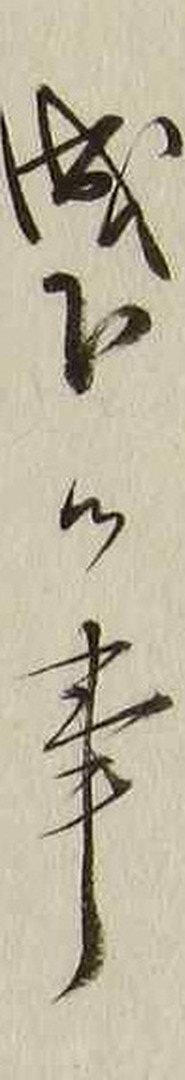成下候事
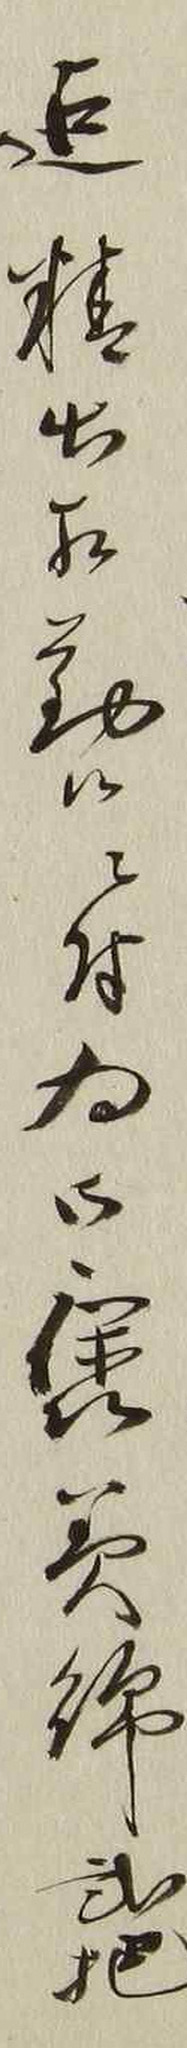迄精出相勤候ニ付御褒美綿弐把
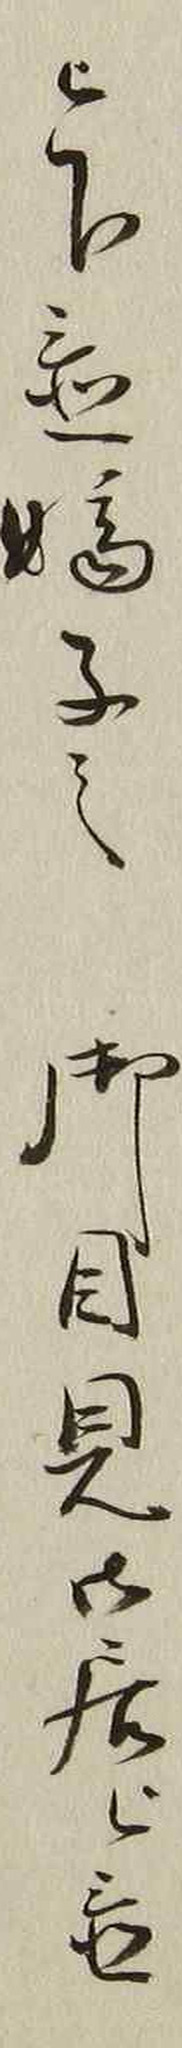被下置嫡子之御目見御居被置
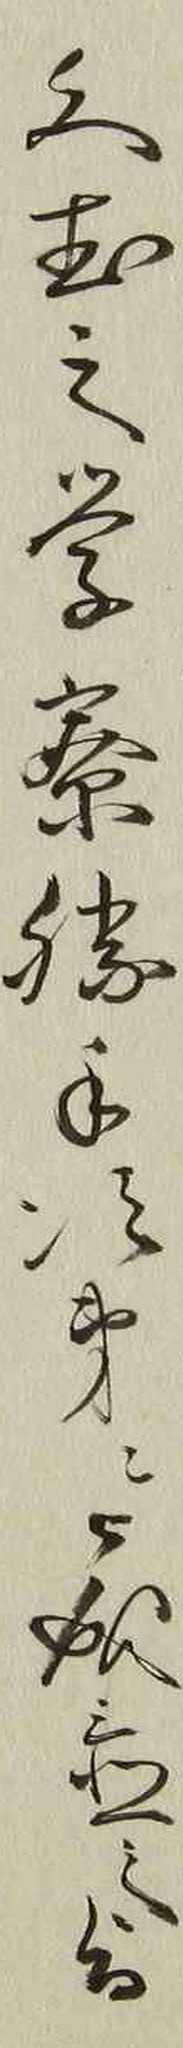文武之学寮勝手次第ニ被成置之旨
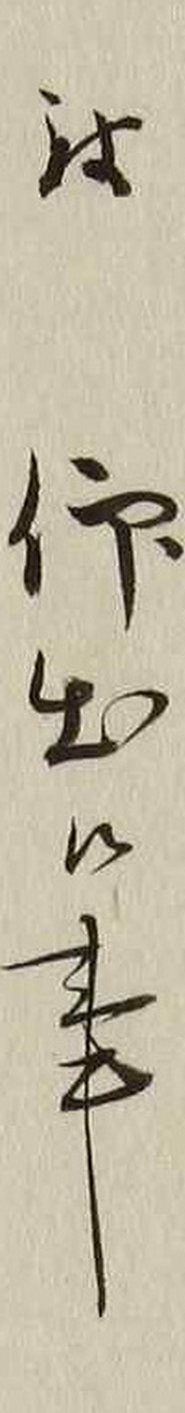被仰出候事
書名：諸士系譜　巻之163　な之部5
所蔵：会津若松市立会津図書館
